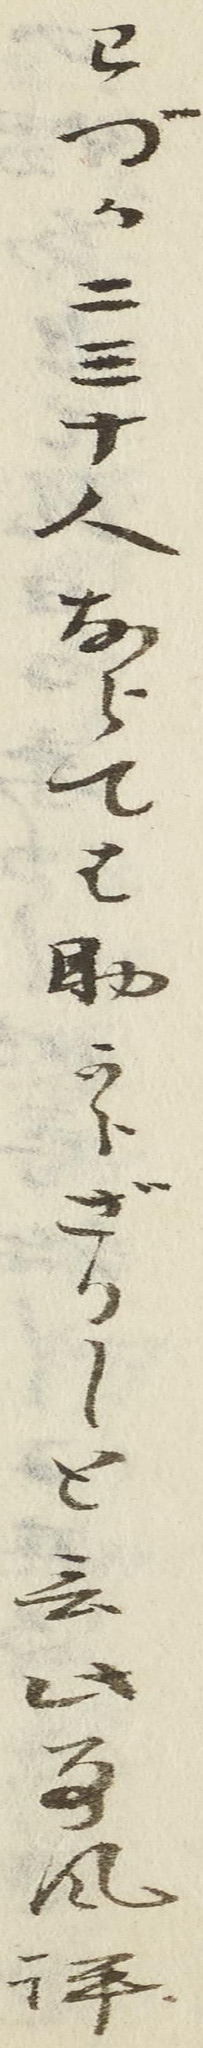わづか二三十人ならては助からざりしと云此事風評
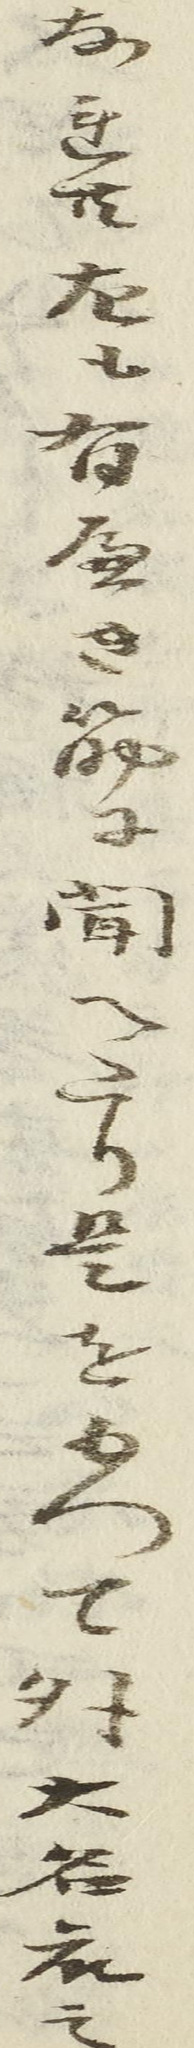なれ共左も有へき筋に聞へたり是をもつて外大名衆之
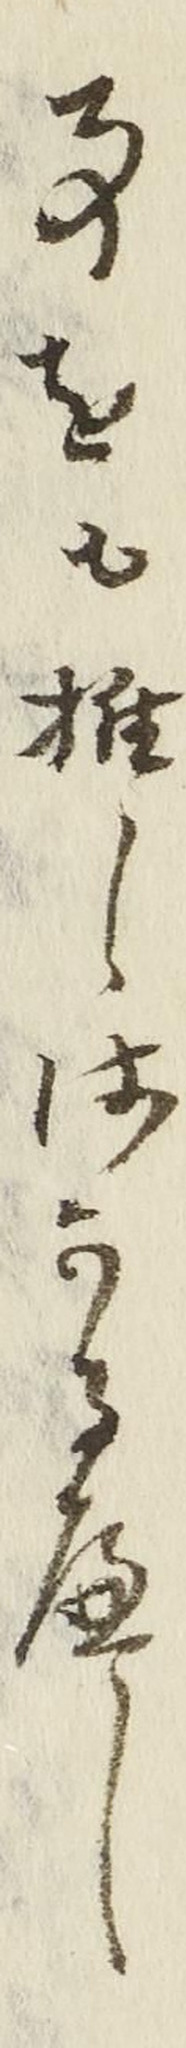事をも推しはかるへし
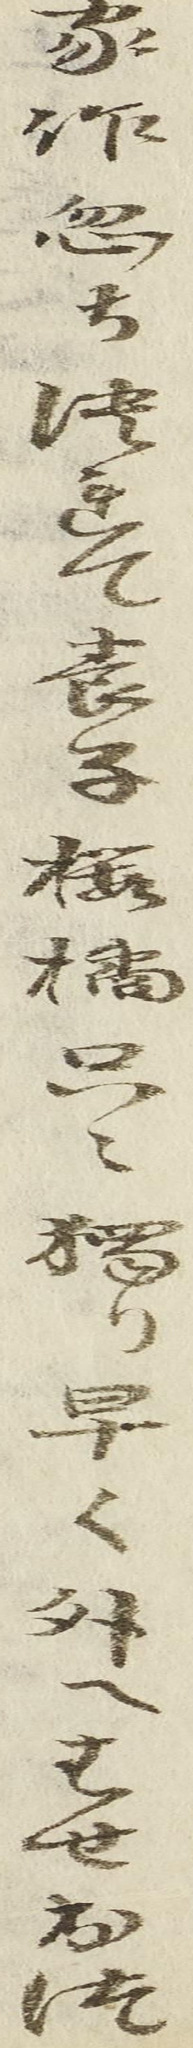家作忽ち潰れて養子桜橘只々獨り早く外へはせ出す

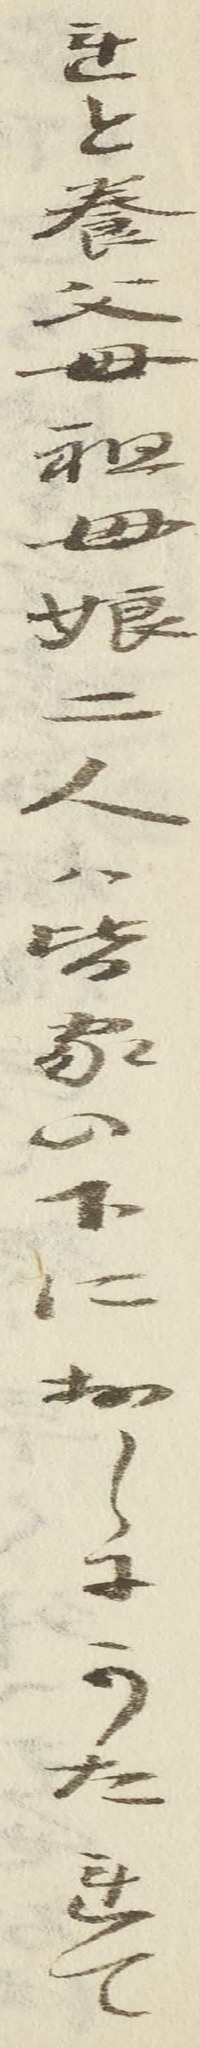れと養父母祖母娘二人ハ皆家の下におしにうたれて
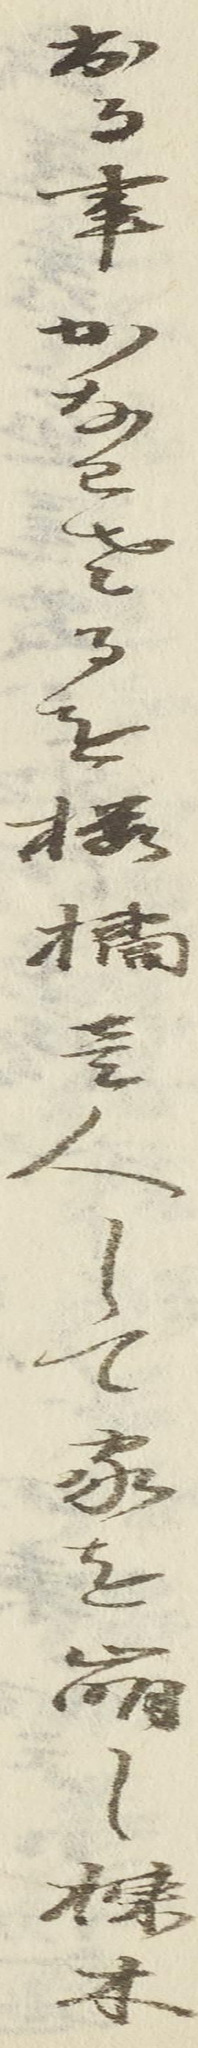出る事かなわさるを桜橘壱人して家を崩し棟木
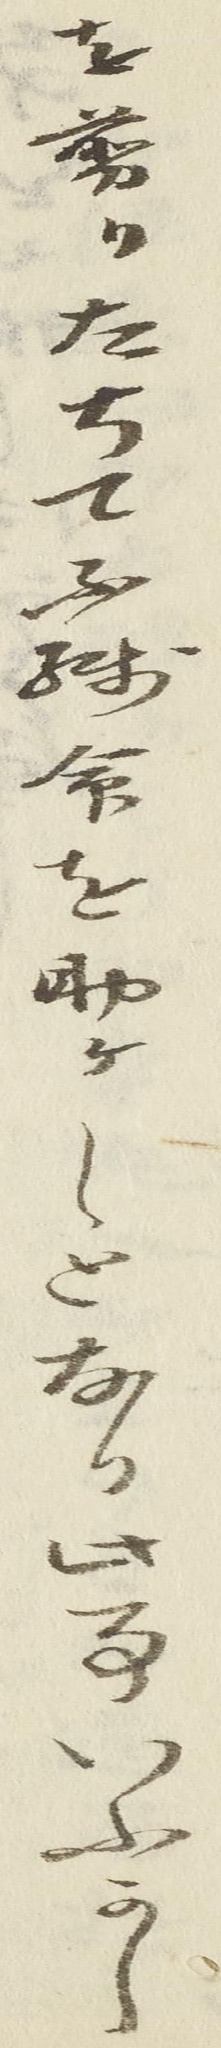を剪りたちて不残命を助ヶしとなり此事いふかし
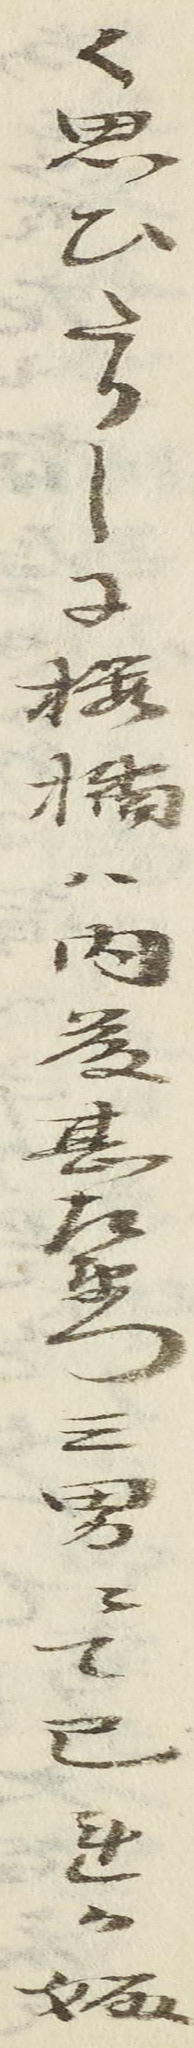く思ひたりしに桜橘は内藤甚左衛門三男二て己れか娵
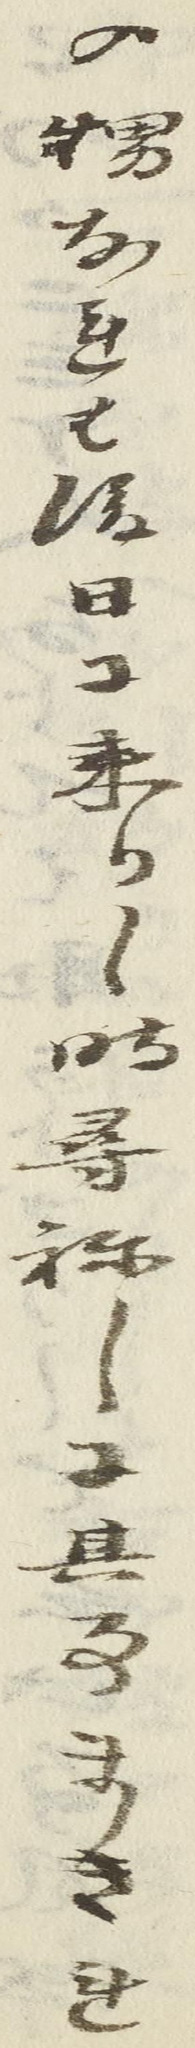の甥なれは後日に来りし時尋ねしに其事まきれ
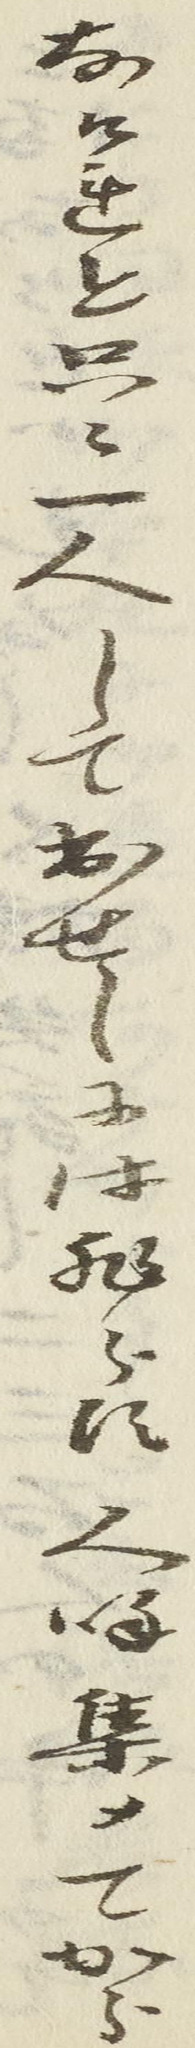なけれと只々一人して出せしには非らす人呼集メてから
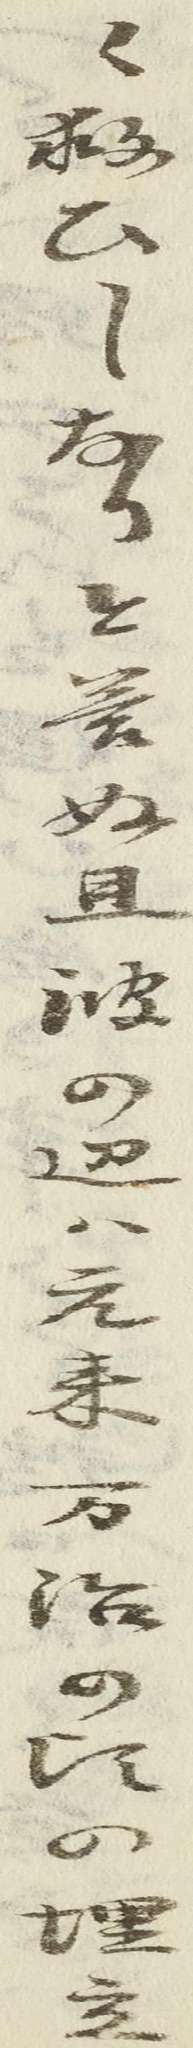く救ひしなりと答ぬ且彼の辺ハ元来万治の頃の埋立
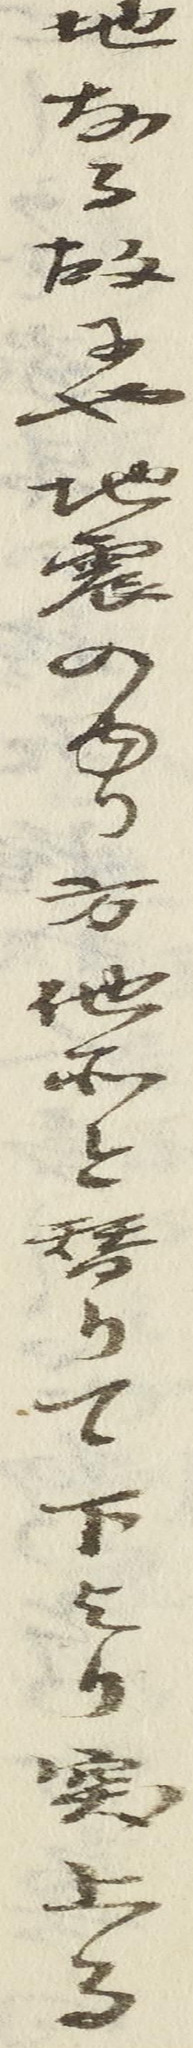地なる故にや地震のゆり方他所と替りて下より突上る
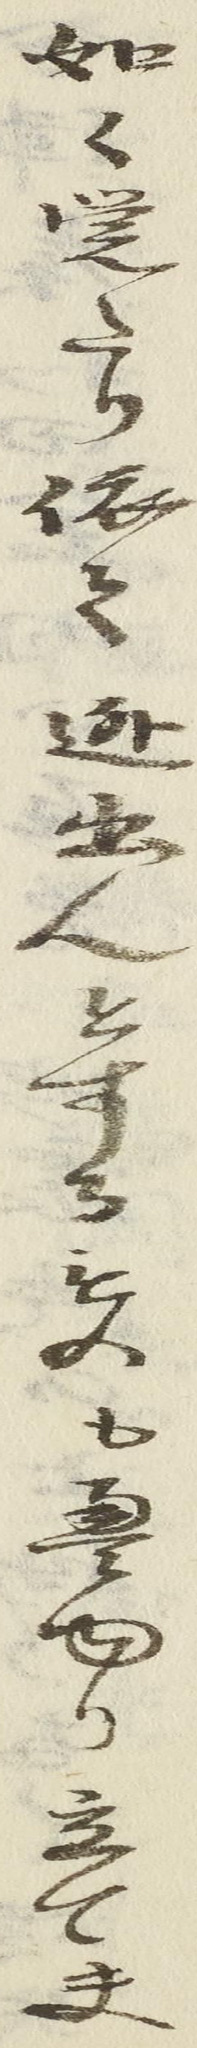如く覚たり依て逃出んとするものも畳ゆり立て夫
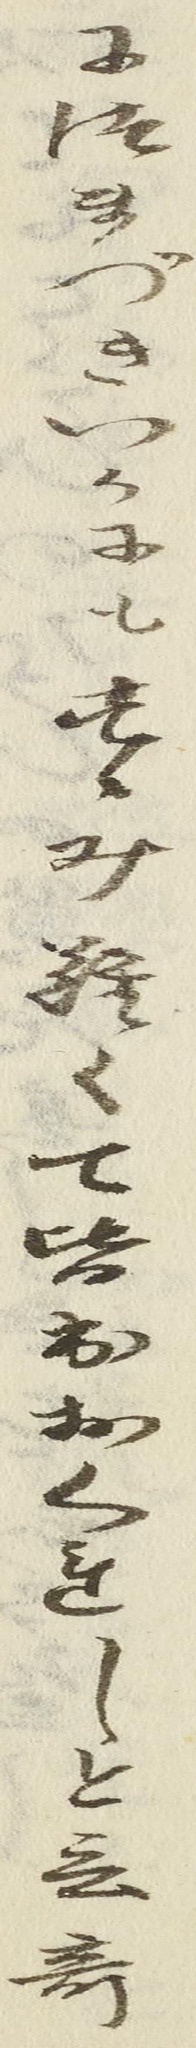につまづきいかにもすゝみ難くて皆出おくれしと云奇
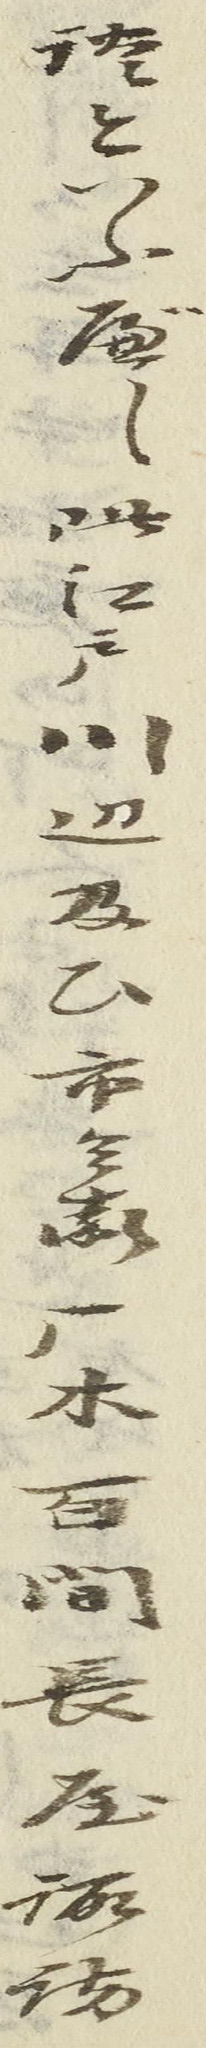談といふべし此江戸川辺及ひ市兵衛厚木百間長屋諏訪
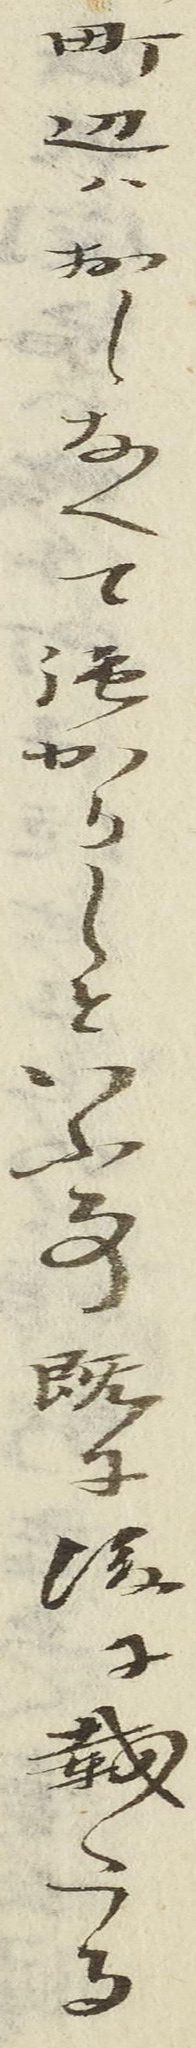町辺ハおしなへて強かりしといふ事既に後に載たる
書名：那為の後見艸　全
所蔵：東京大学地震研究所図書室 Earthquake Research Institute Library, The University of Tokyo, JAPAN
